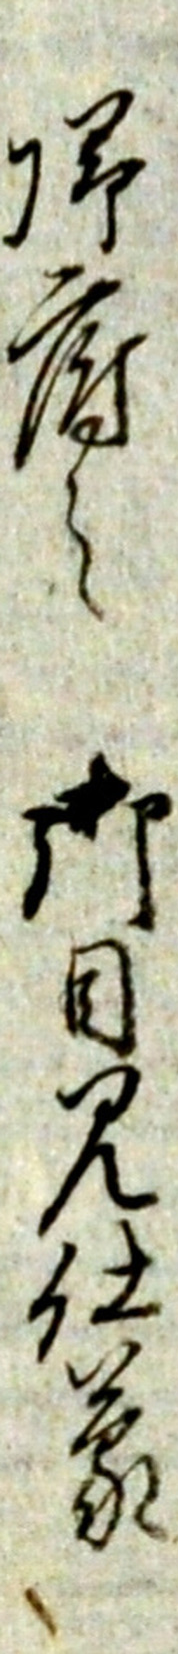帰府之御目見仕蒙
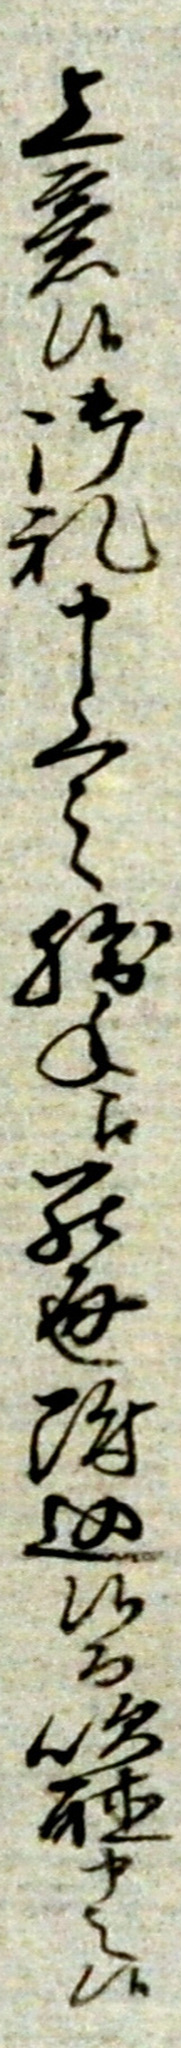上意候御礼申上之勝手江罷通附込候而吹聴申之候
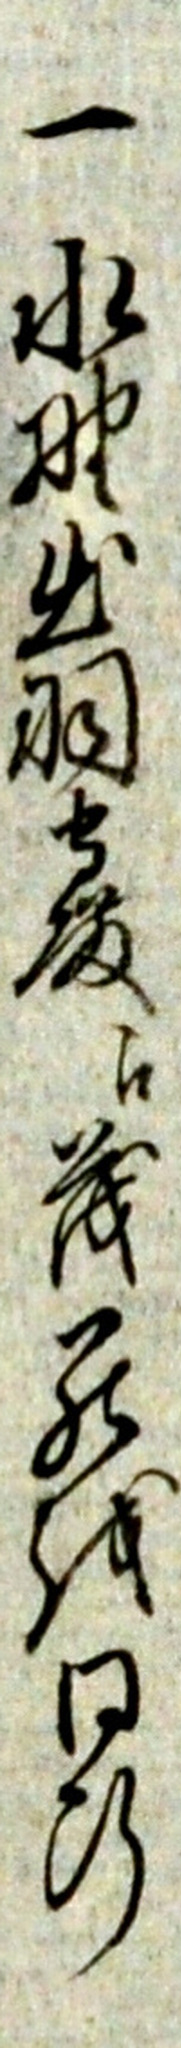一水野出羽守殿江も罷越同断
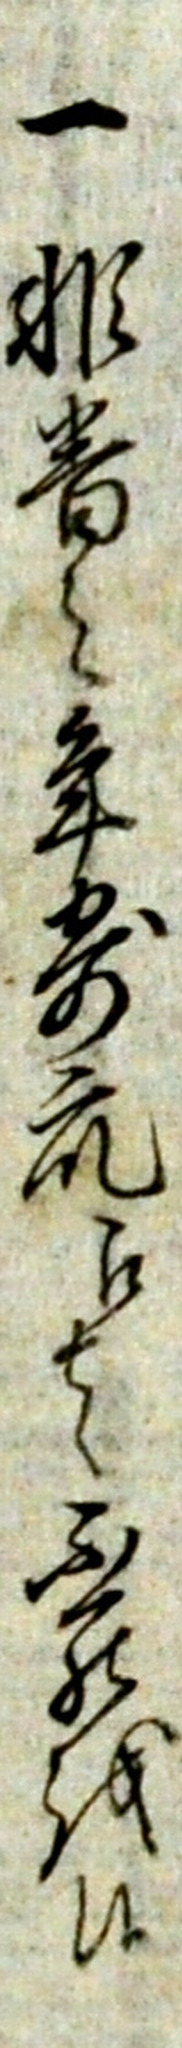一非番之年寄衆江者不罷越候

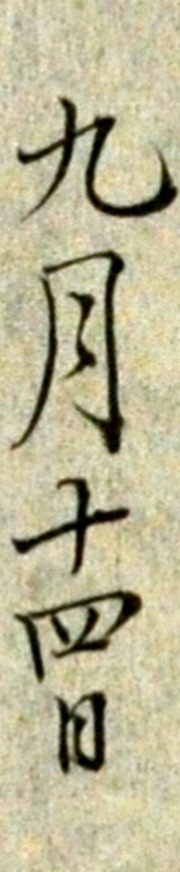九月十四日
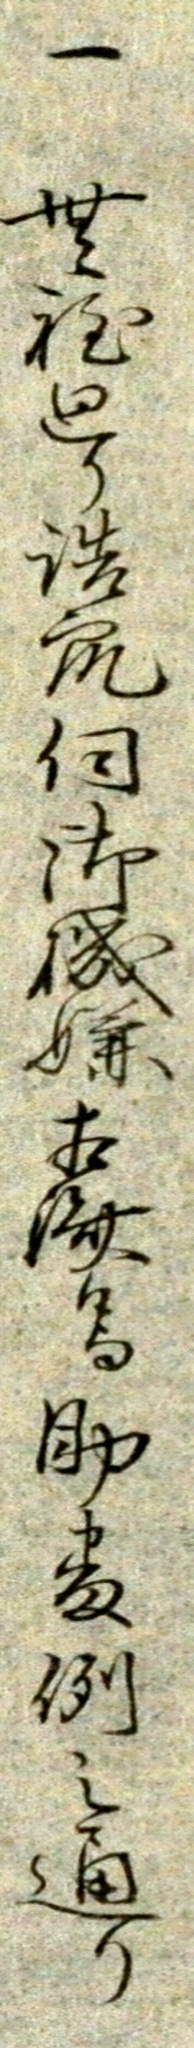一無程廻り詰衆伺御機嫌相済候而助番例之通り
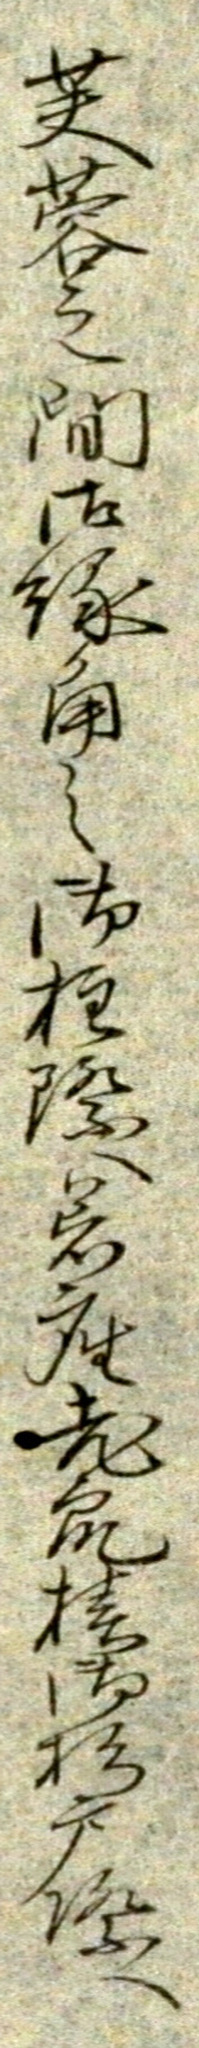芙蓉之間御縁角之御柱際へ着座老衆様御杉戸際へ
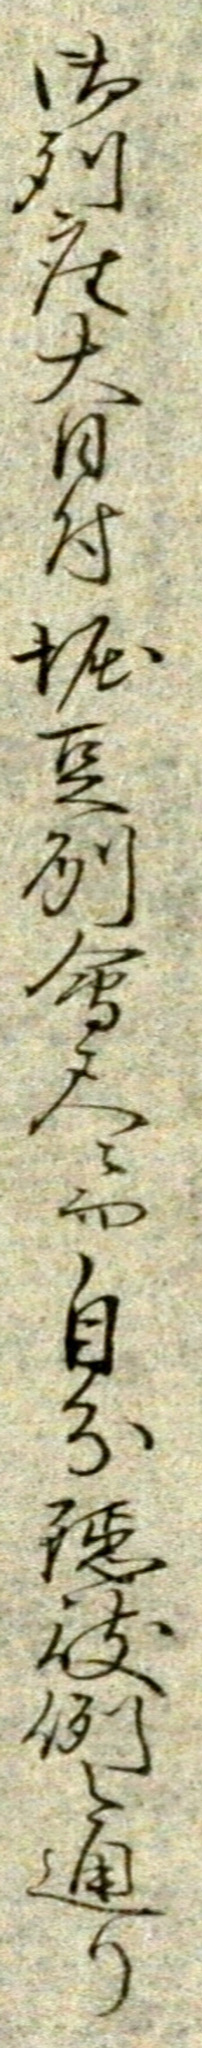御列座大目付堀豆州会尺ニ而自分隠岐例之通り
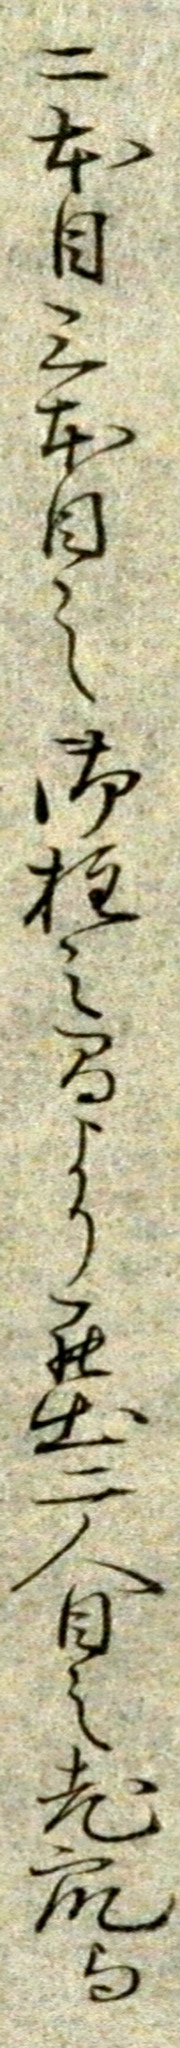二本目三本目之御柱之間より罷出二人目之老衆と
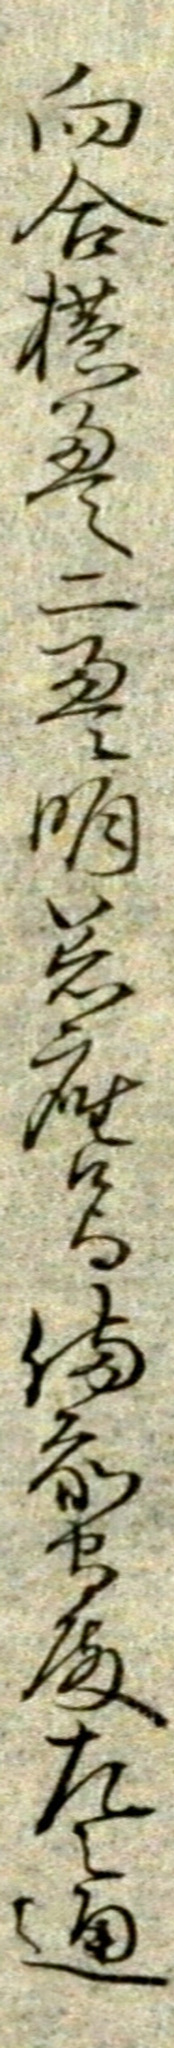向合横畳二畳明着座候と備前守殿左之通
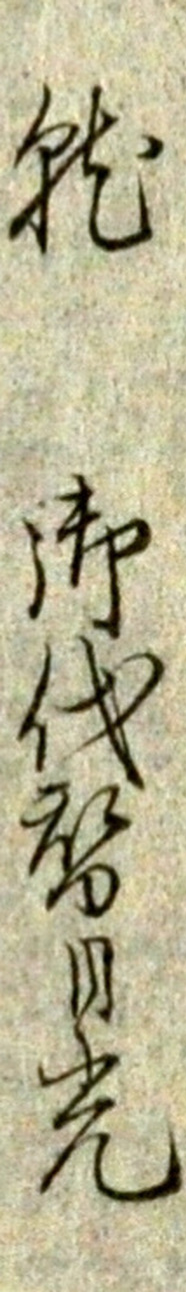就御代替日光
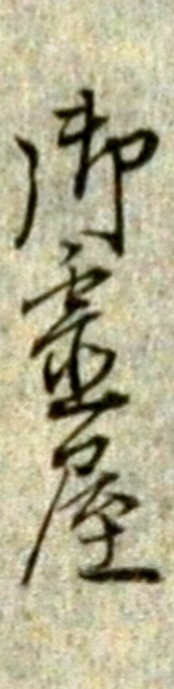御霊屋
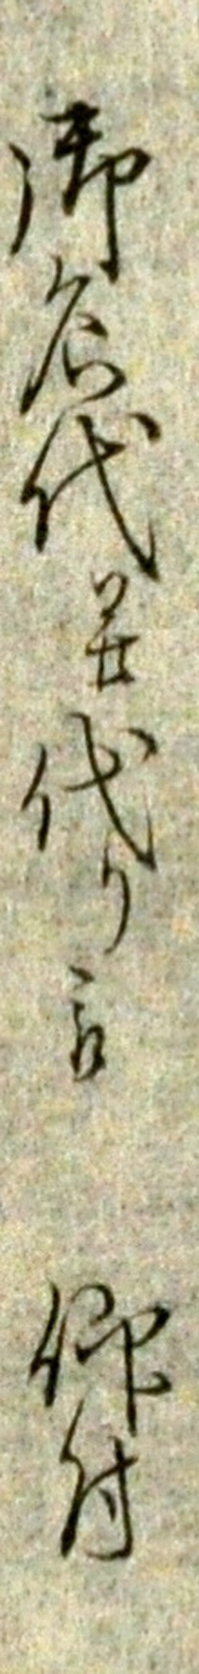御名代幷代り被仰付
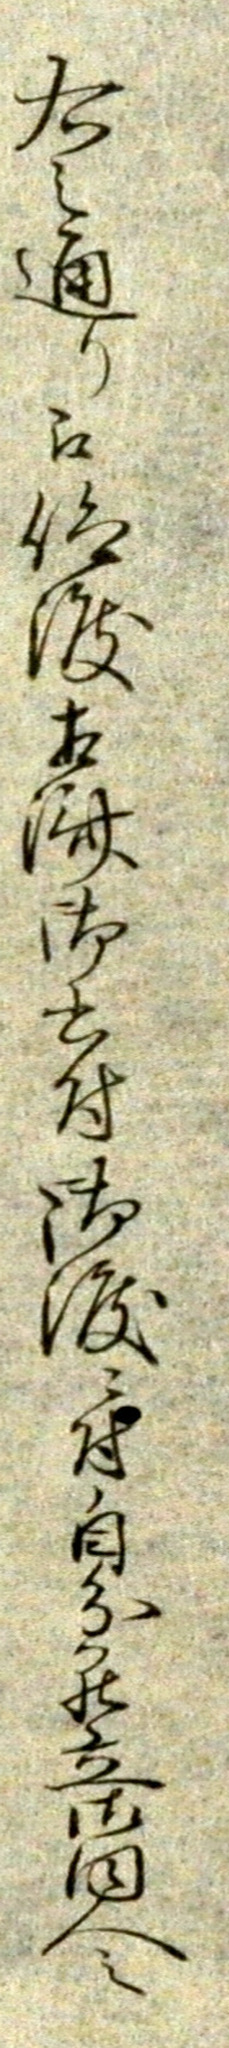右之通り被仰渡相済御書付御渡ニ付自分罷立御同人之
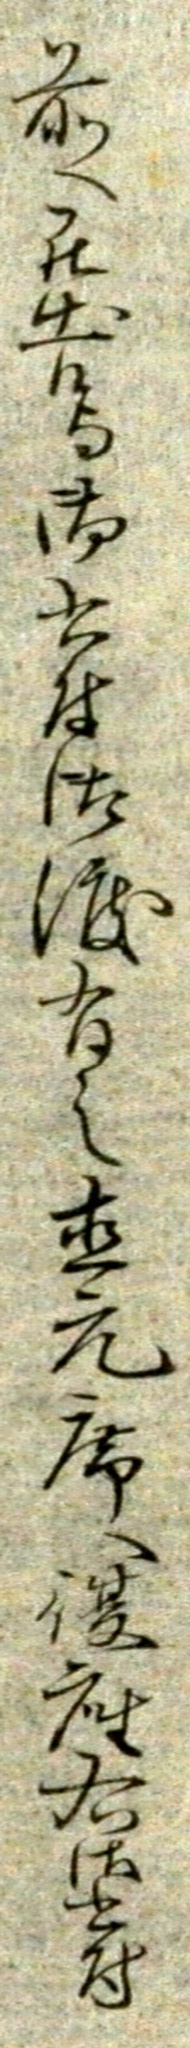前へ罷出候と御書付御渡有之直元席へ復座右御書付

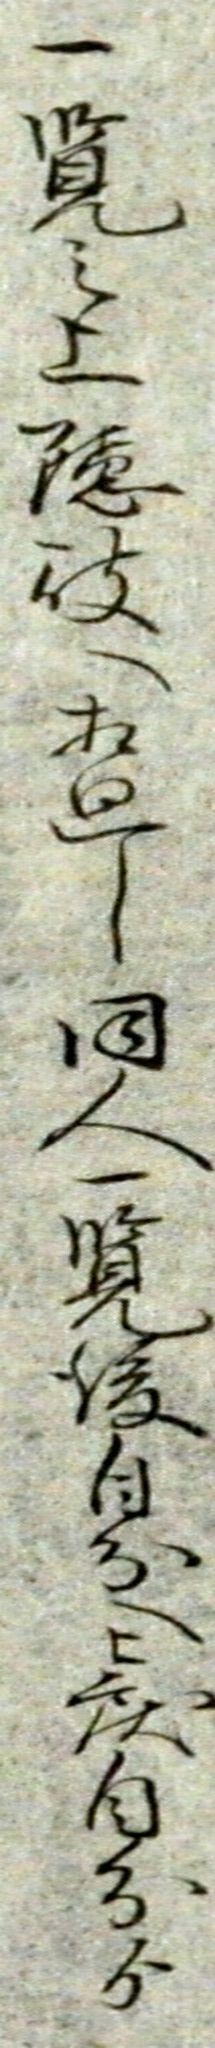一覧之上隠岐へ相廻し同人一覧後自分へ被戻自分ゟ
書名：日光御名代相勤候節ノ留
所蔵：伊那市立高遠町図書館・合同会社AMANE
